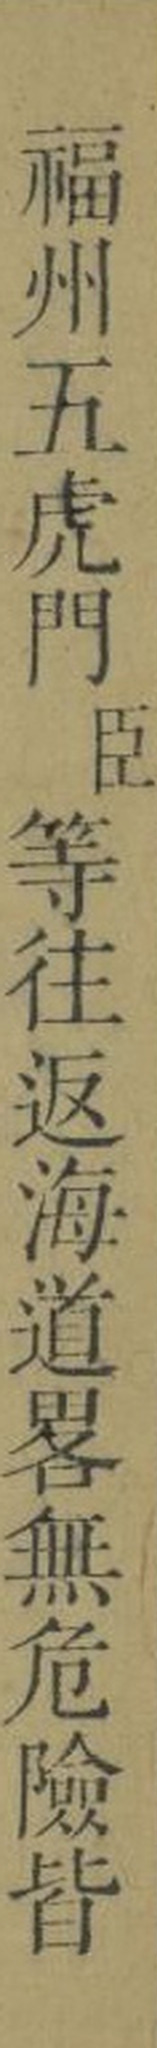福州五虎門臣等往返海道畧危險皆
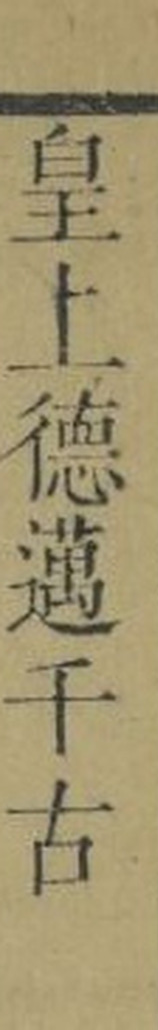皇上德邁千古
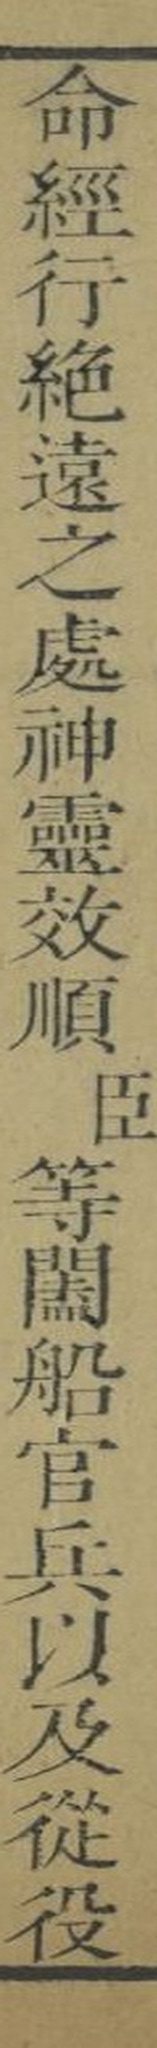命經行絶遠之處神靈效順臣等闔船官兵以及從役
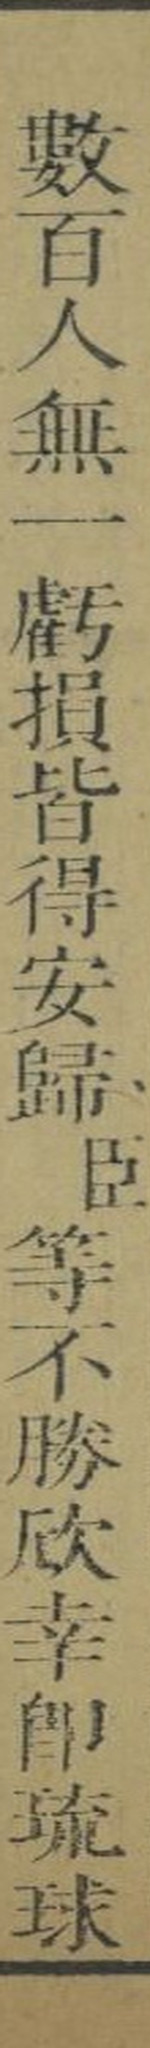數百人無一虧損皆得安歸臣等不勝欣幸卽琉球
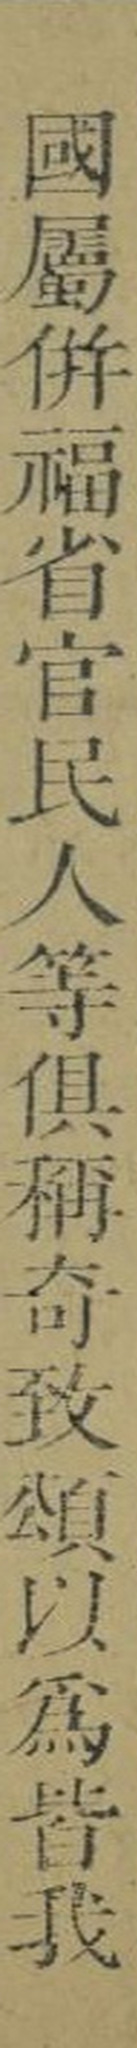國屬倂福省官民人等俱稱奇致頌以爲皆我
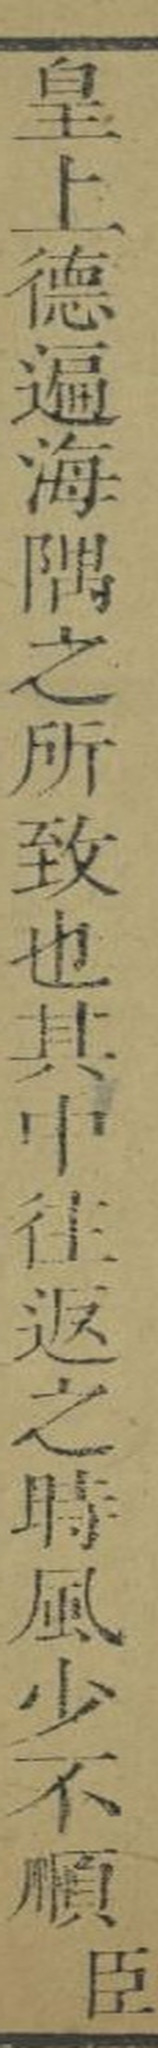皇上德遍海隅之所致也其中往返之時風少不順臣
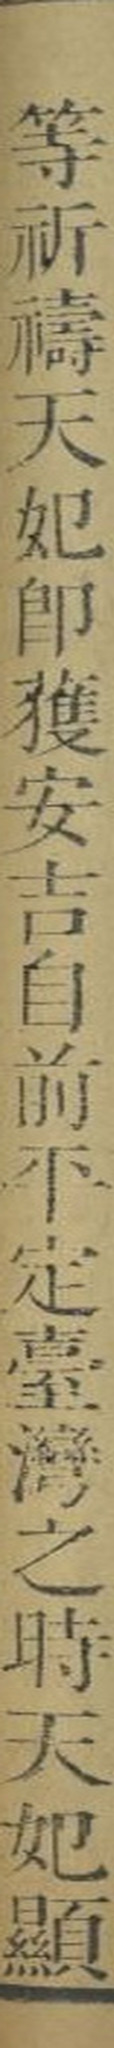等祈禱天妃卽獲安吉自前平定臺灣之時天妃顯
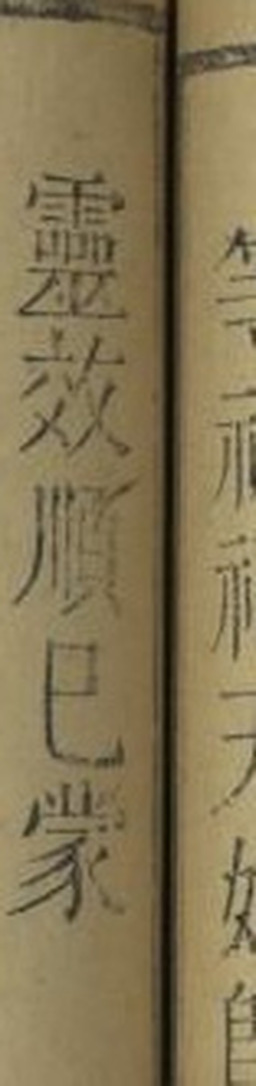靈效順巳蒙
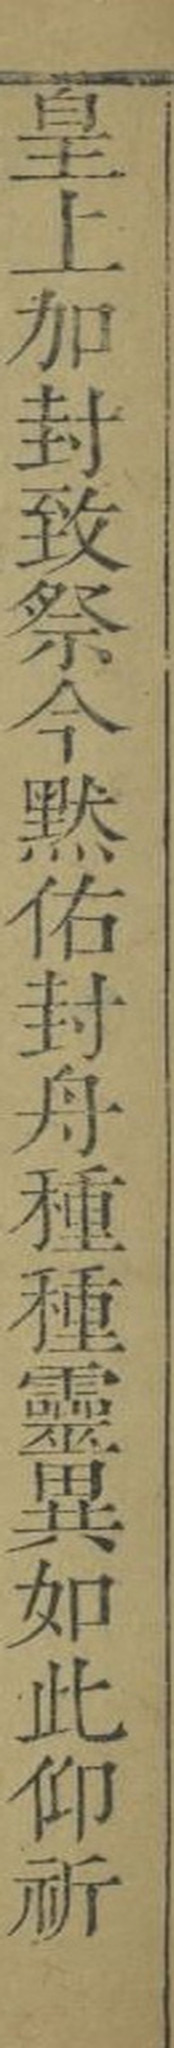皇上加封致祭今默佑封舟種種靈異如此仰祈
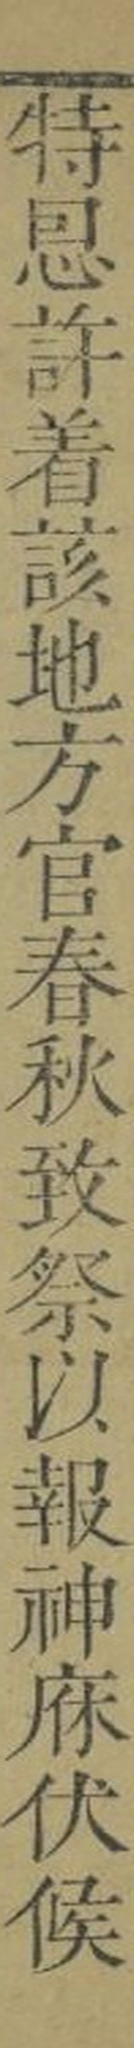特㤙許着該地方官春秋致祭以報神庥伏候
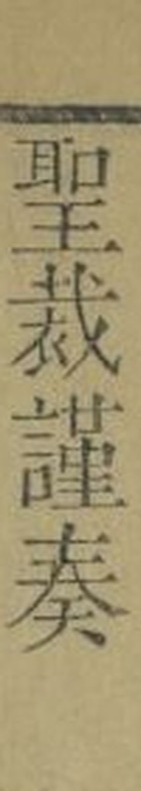聖裁謹奏
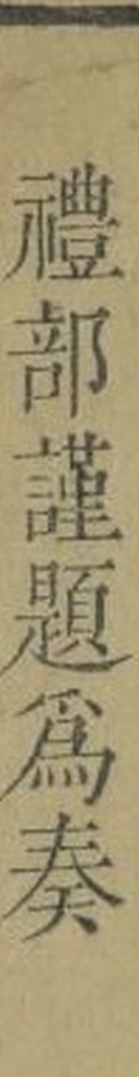禮部謹題爲奏
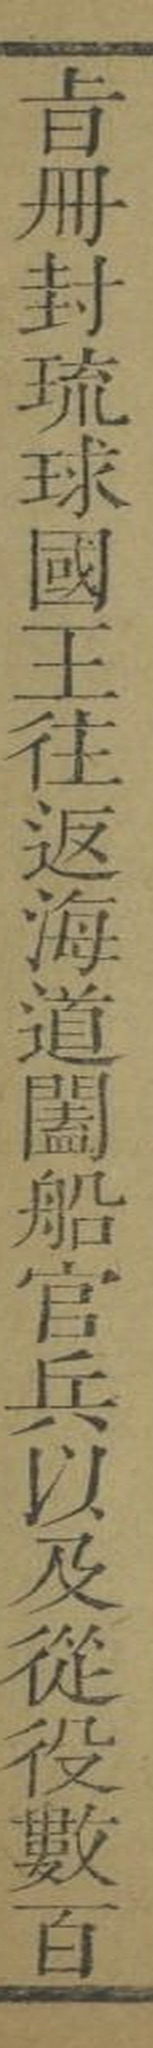㫖冊封琉球國王往返海道闔船官兵以及從役數百

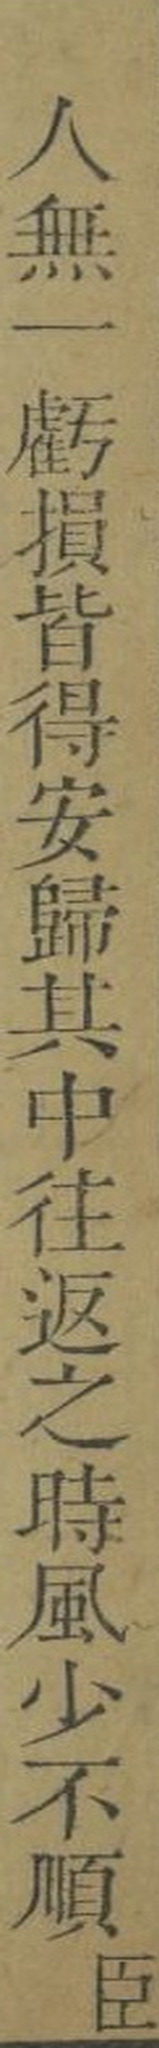人無一虧損皆得安歸其中往返之時風少不順臣
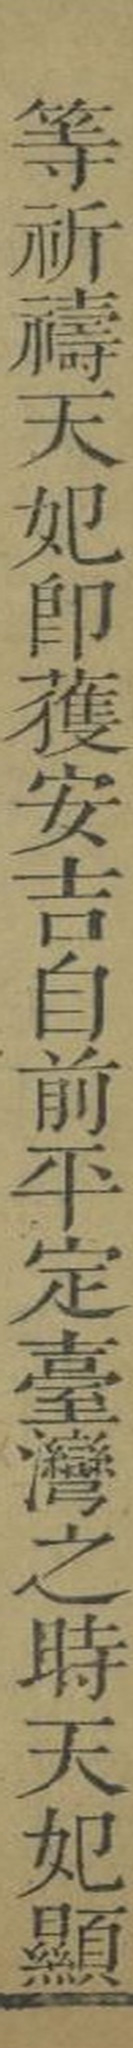等祈禱天妃卽獲安吉自前平定臺灣之時天妃顯
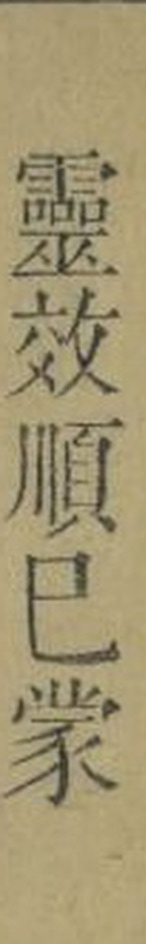靈效順巳蒙
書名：中山伝信録 巻一
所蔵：University of the Ryukyus Library
